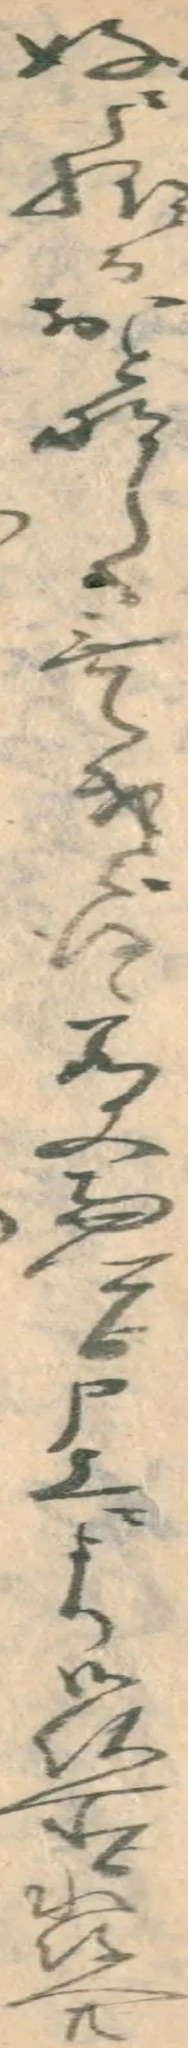好ミ候様ニ而おとなしく無之義ニ被存候若又両郷ゟ申上ニより御役所ゟ水役人共
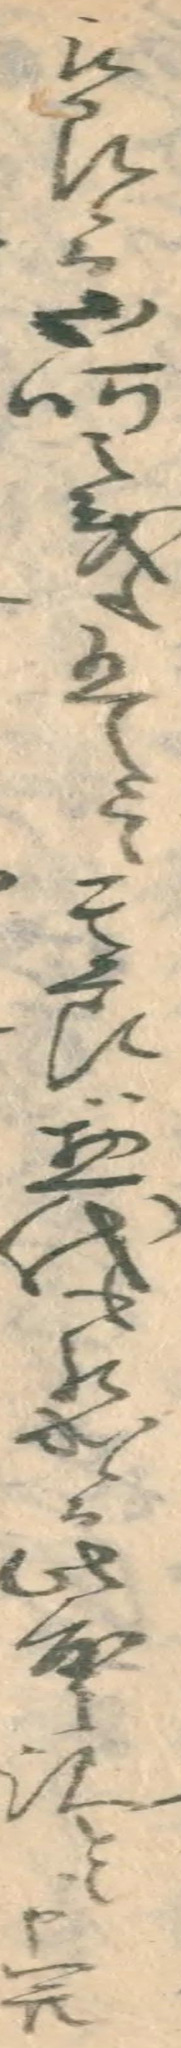被召候而御呵之義も有之候ハヽ其節ハ惣代も被出候而此度之訳とも申開
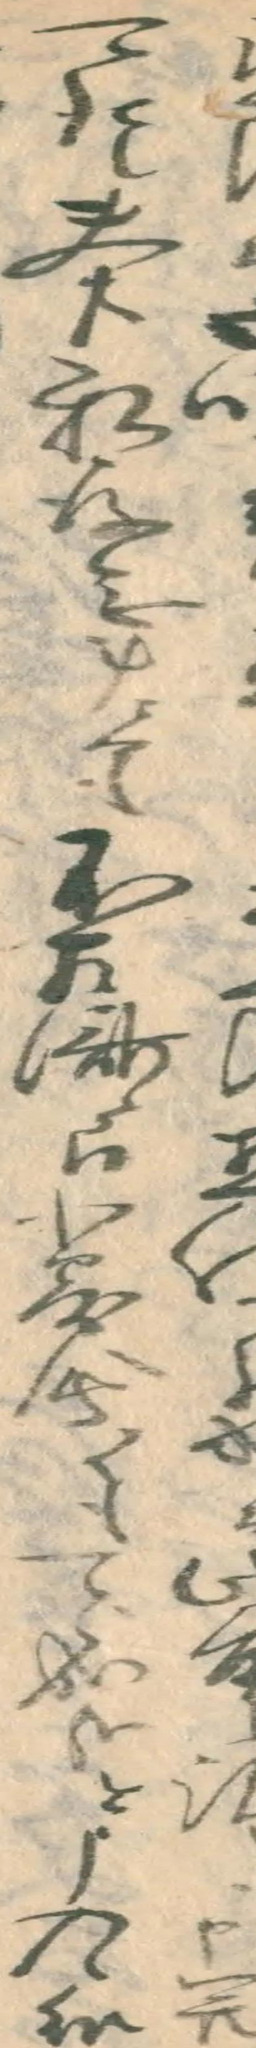可仕候夫共私存念計ニ而も不相済候間小寄会ニても可被成哉と申入候処
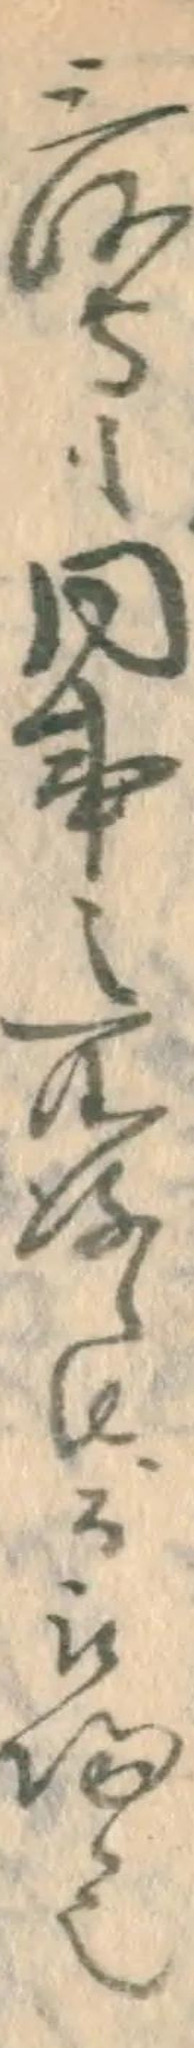三河守も同事之所存候由ニ而被帰候也
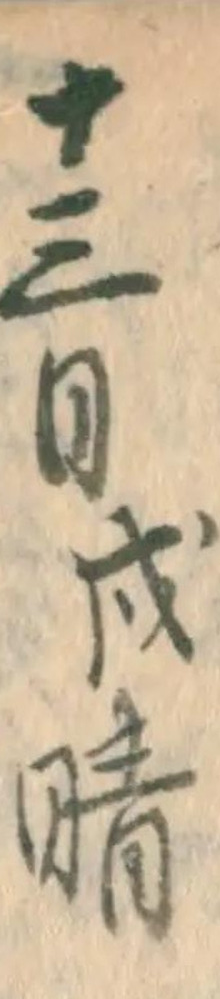十三日戊晴
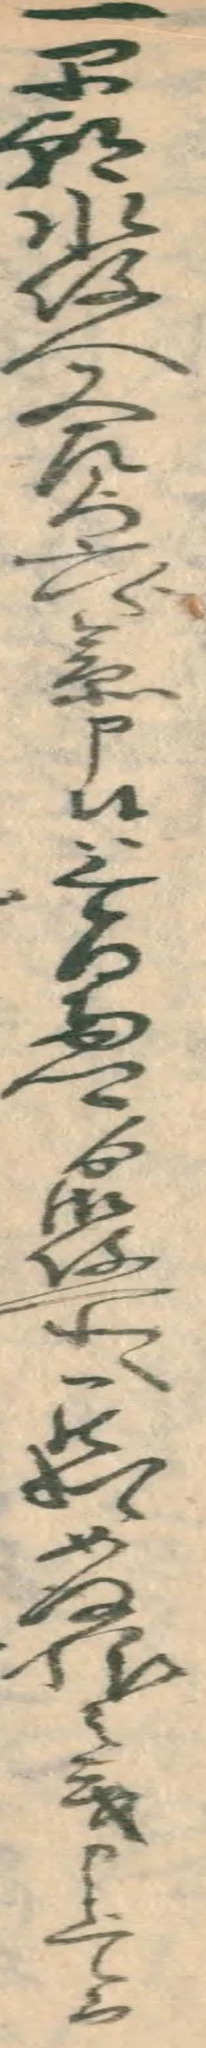一早朝水役人又左衛門六郎兵衛申候ハ今日両郷ゟ御役所へ罷出候如何様之義申上候而
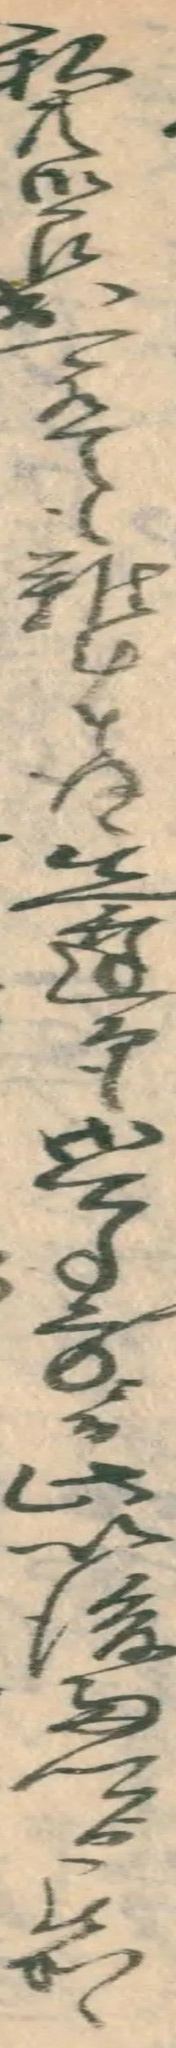私共御召出可有之も難計奉存候先達而も御公事方ニ而此以後両郷ゟ罷出候
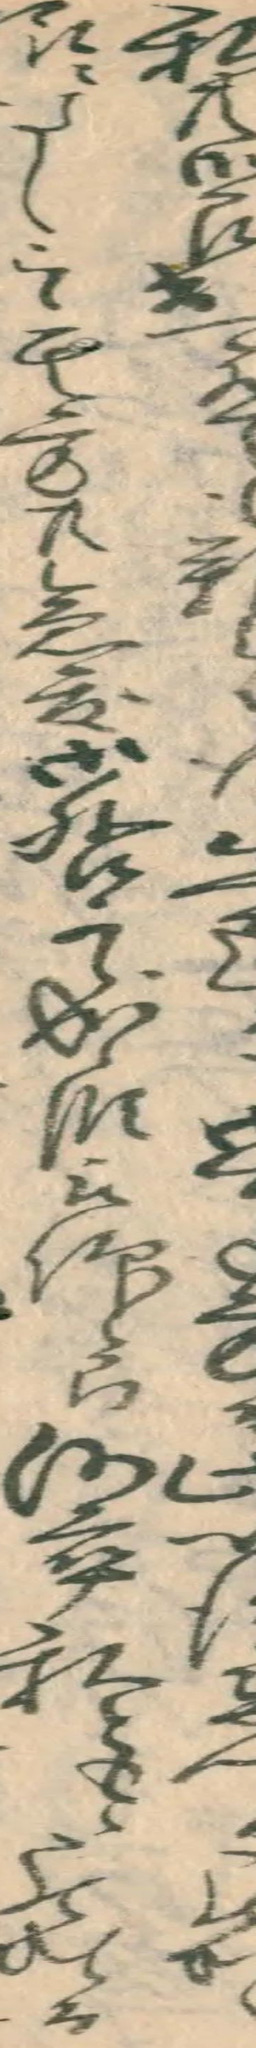様ニいたし候ハヽ其方共急度御咎可被成候段被仰候間何卒私とも罷出候而
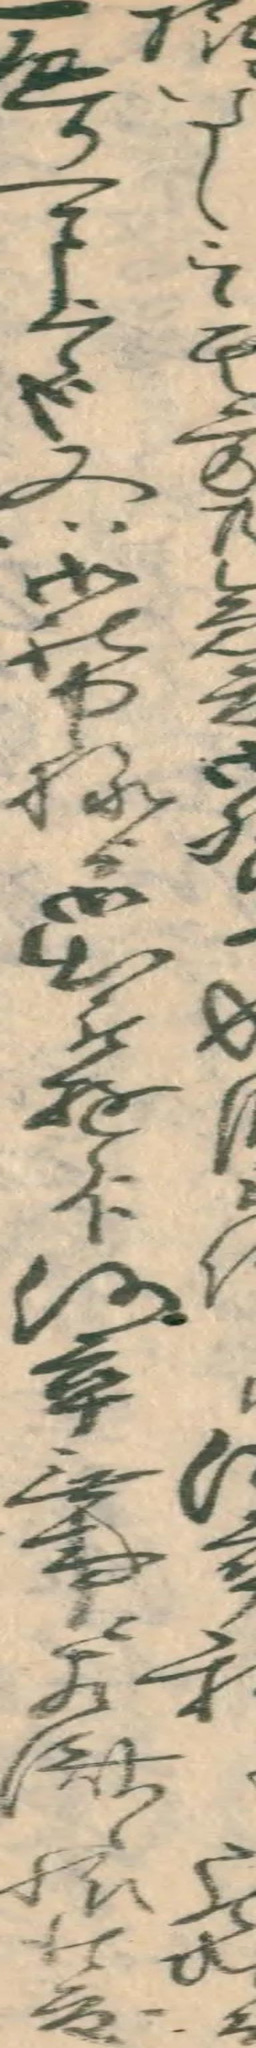一通り可申上候哉又ハ御社中様ゟ御出被遊被下何卒無事ニ相済候様仕度
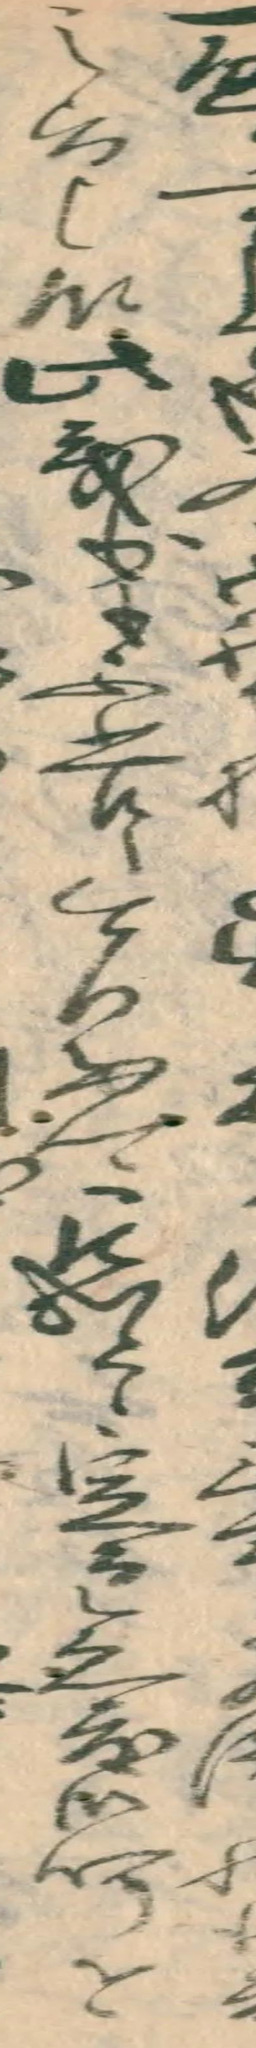之旨申候故此義少も不苦候今日両郷罷出候ハヽ定而急度御呵を
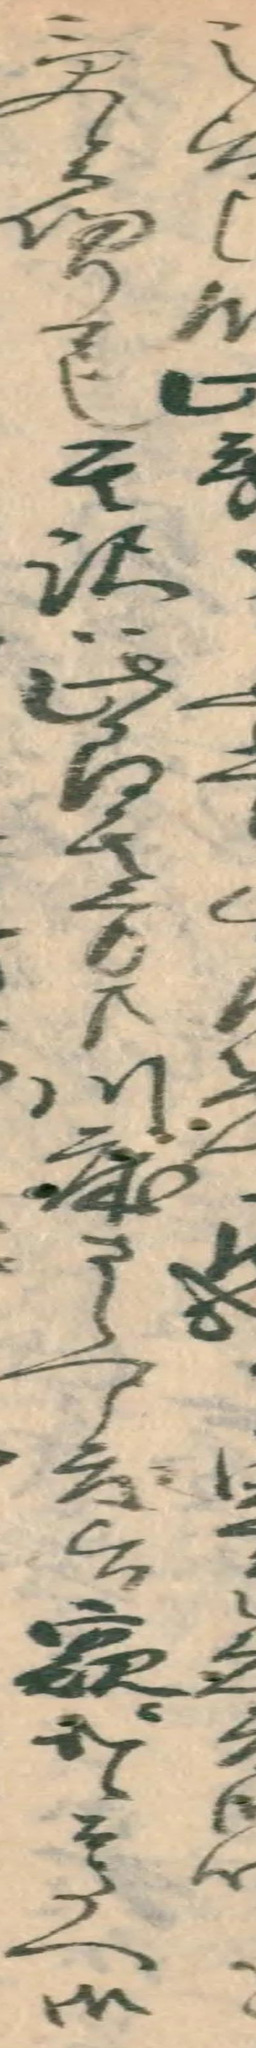受候而帰り可申候其訳ハ此間其方共川床さらへ申度旨窺ニ出候而さへ御
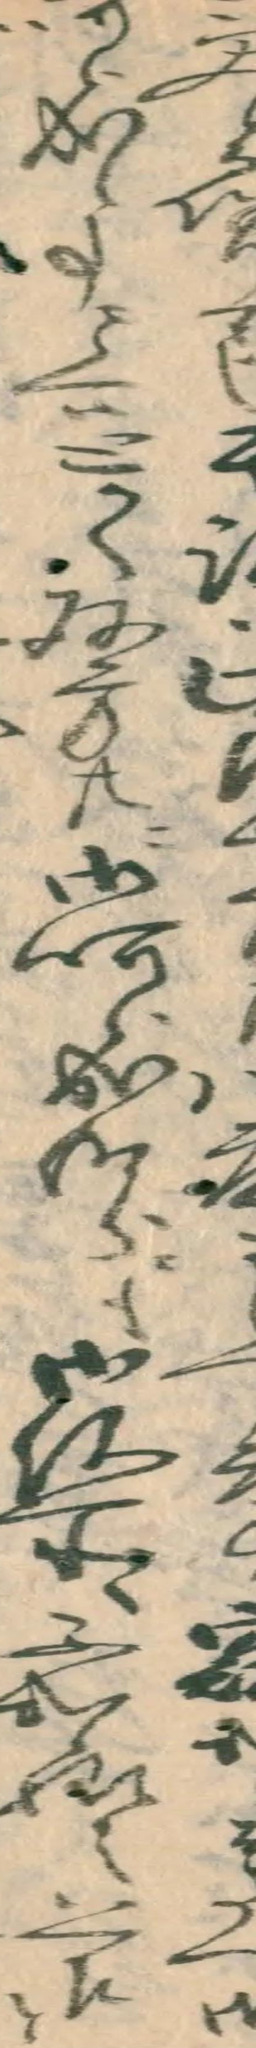呵被成候事ニ候へハとかく双方共ニ御呵被成何分ニも御役所へ不出様之思召と
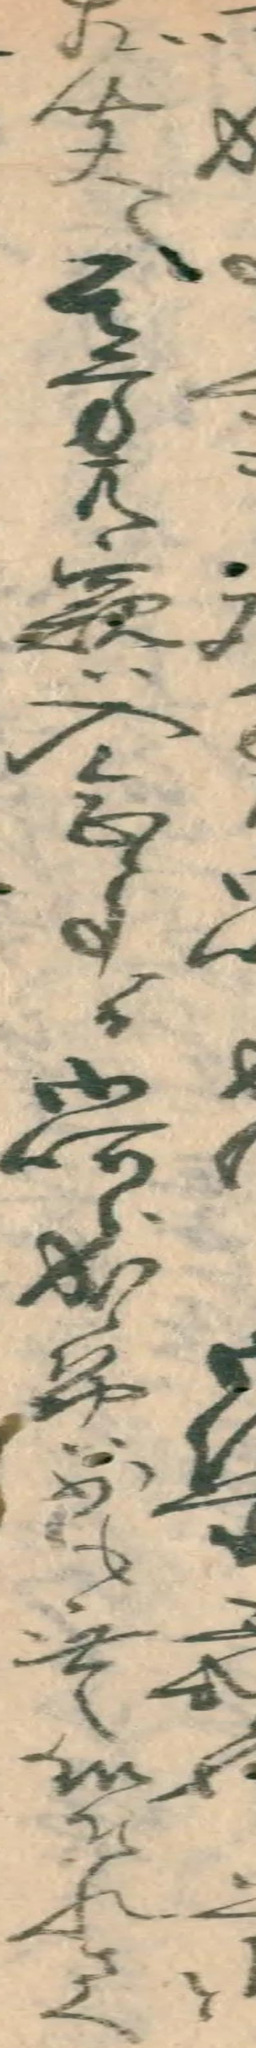相聞へ候其方共窺ハ入念事ニ而御呵被成候筋ハ少も無之処それさへ
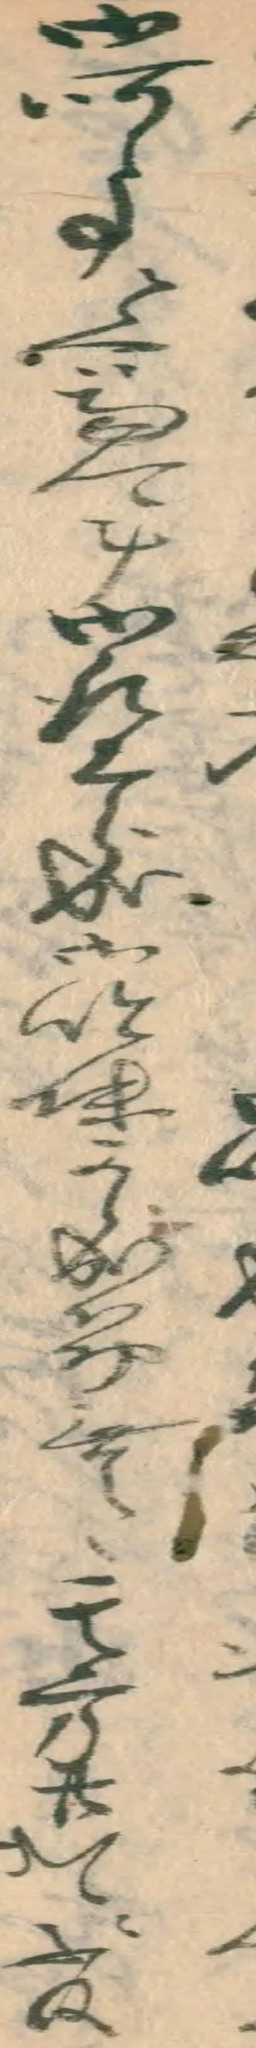御呵候事ニ候へハ両郷計御取上被成御吟味可被成筋無之候其方共出候ニ不及
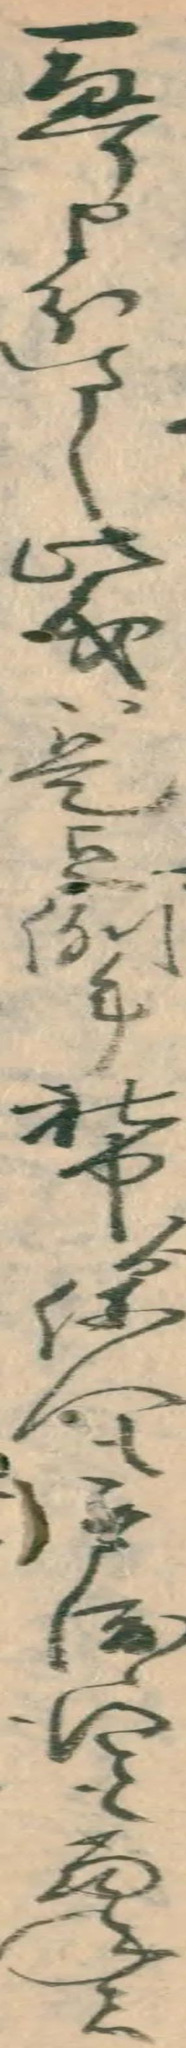一通り申分いたし此義ハ是迄例年社中ゟ役人も被申渡候得とも当年者
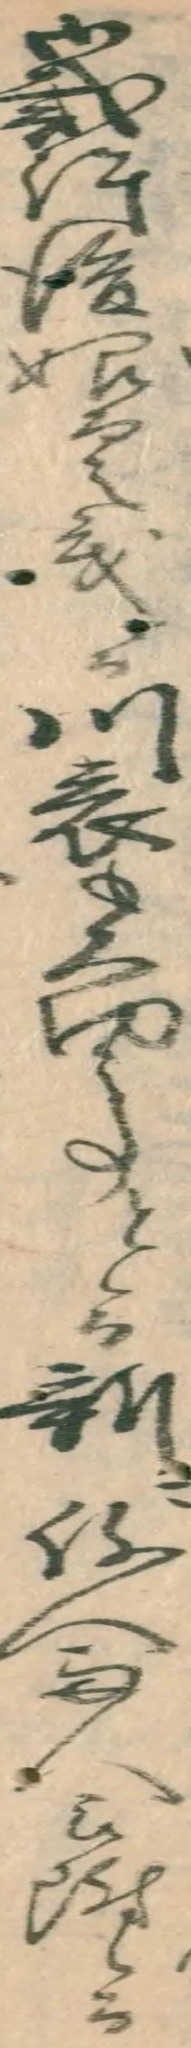御裁許後始而之義ニ而川表も大切之事と候而新ニ役人両人被付候而
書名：賀茂社記録. 第58冊
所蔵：国立国会図書館 National Diet Library, JAPAN
